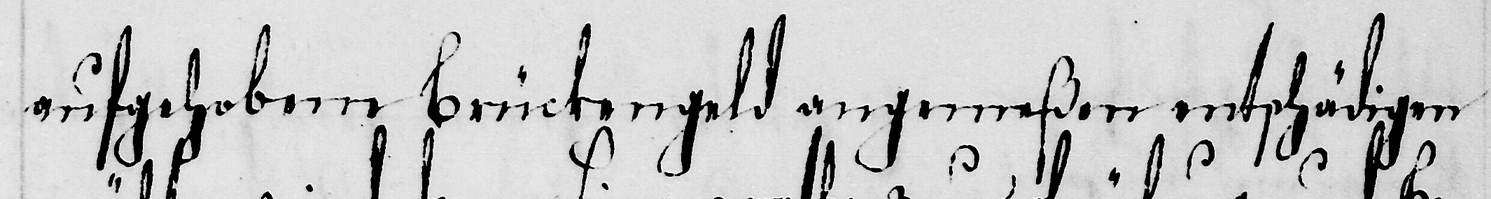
aufgehobene Brückengeld angemeßen entschädigen
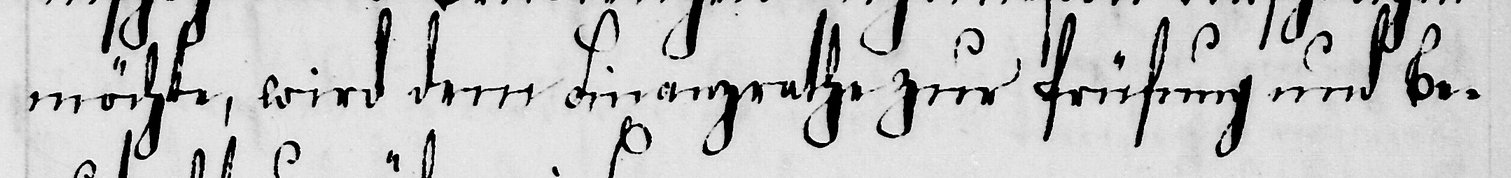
möchte, wird dem Finanzrathe zur Prüfung und Be¬
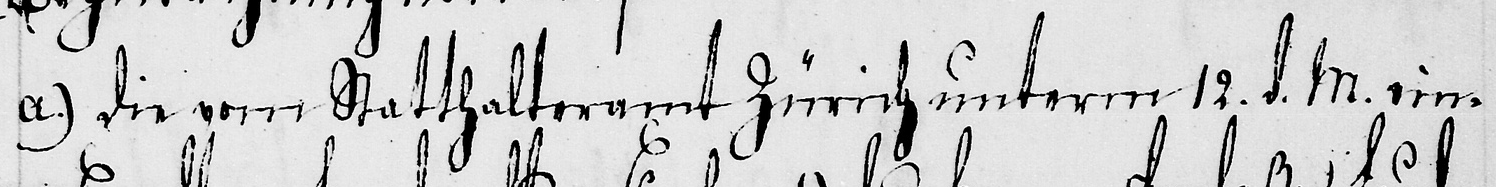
a.) die vom Statthalteramt Zürich unterm 12. d. M. ein¬
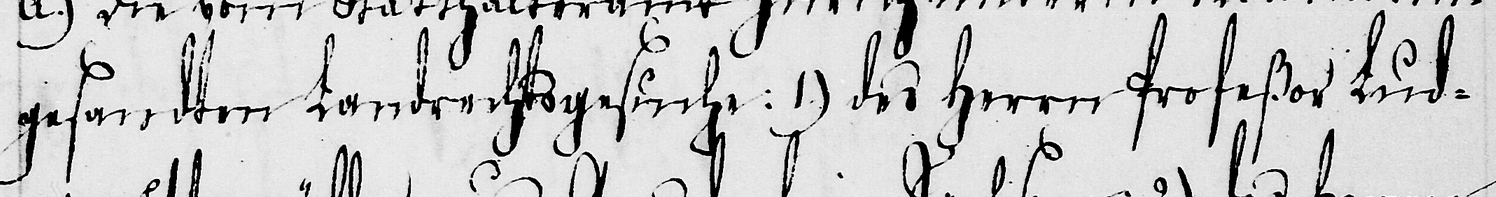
gesandten Landrechtsgesuche: 1.) des Herrn Profeßor Lud¬
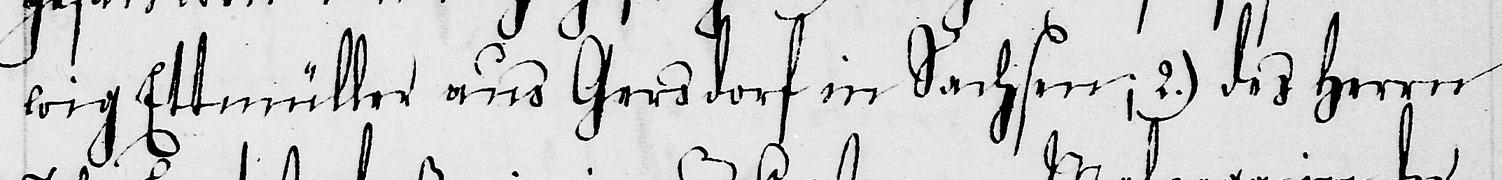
wig Ettmüller aus Gersdorf in Sachsen; 2.) des Herrn
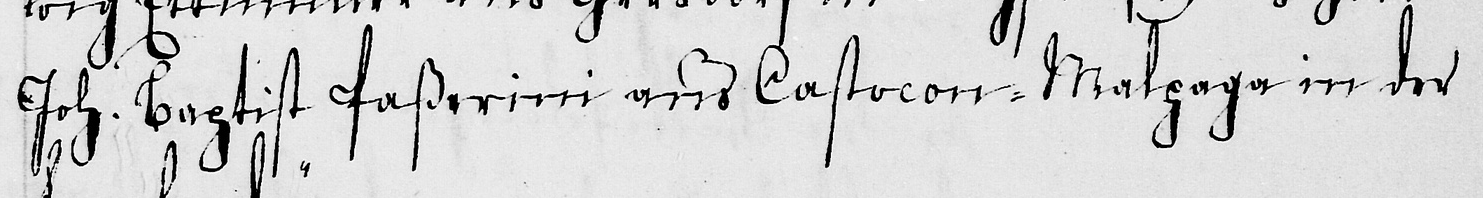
Joh. Baptist Paßerini aus Castocon-Malpaga in der
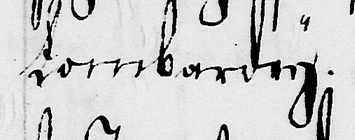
Lombardey.
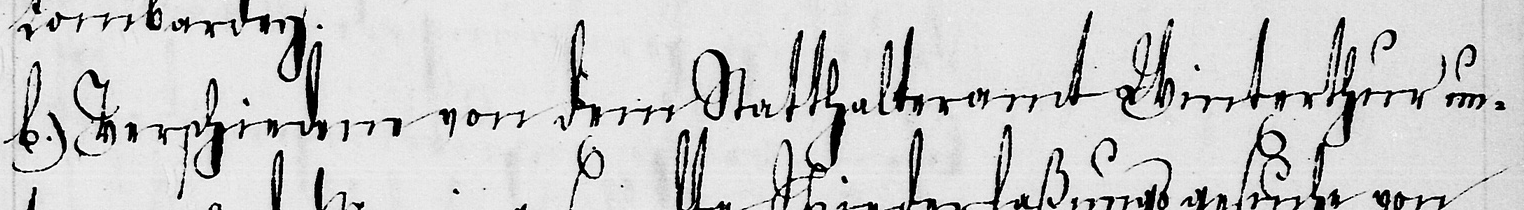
b.) Verschiedene von dem Statthalteramt Winterthur un¬
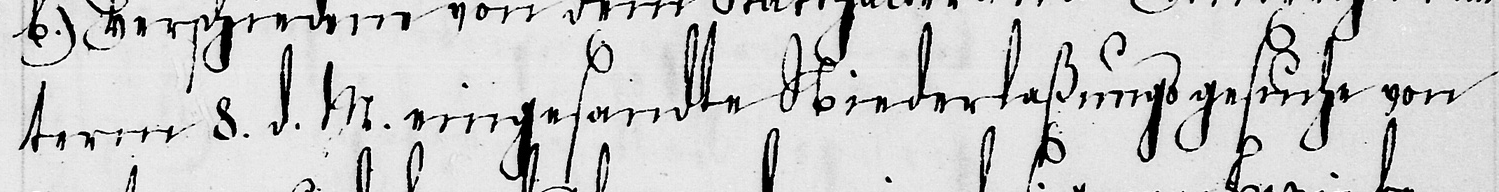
term 8. d. M. eingesandte Niederlaßungsgesuche von
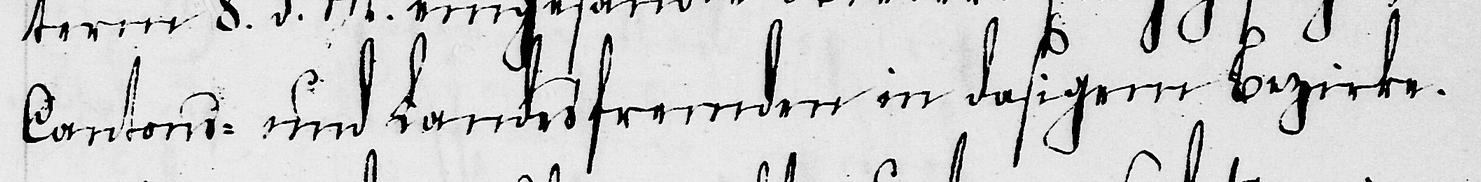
Cantons- und Landesfremden in dasigem Bezirke.
